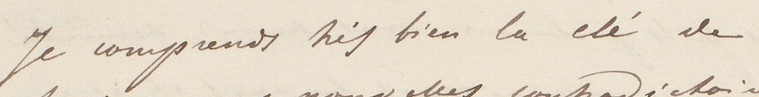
Je comprends très bien la clé de
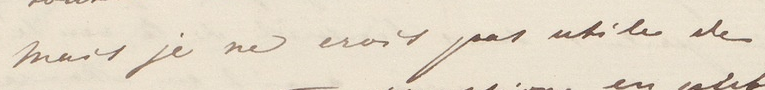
Mais je ne crois pas utile de
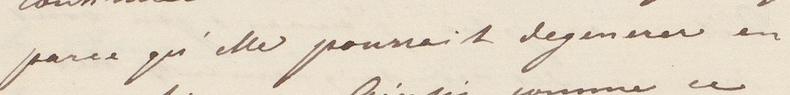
parce qu'elle pourrait degenerer en
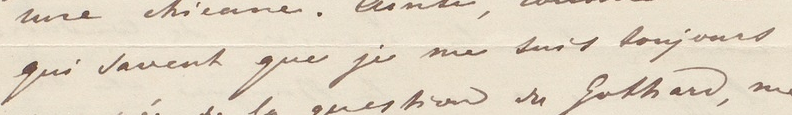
qui savent que je me suis toujours
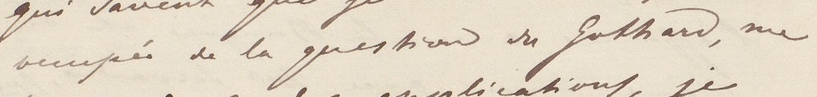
occupée de la question du Gothard, me
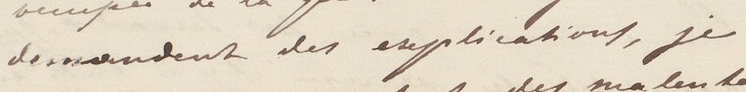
demandent des explications, je
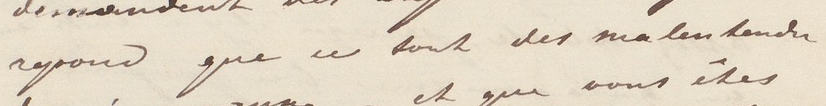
repond que ce tout des malentendu
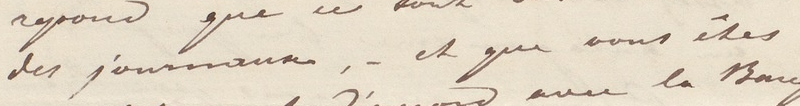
des journaux, – et que vous êtes
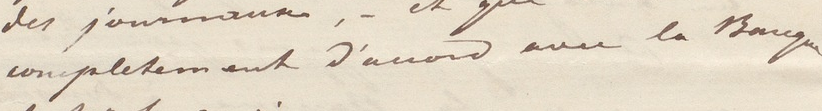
completement d'accord avec la Banque
